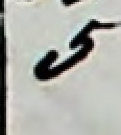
5
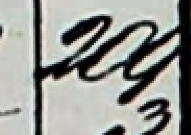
209
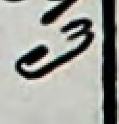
3
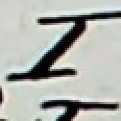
I
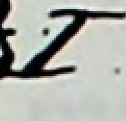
I
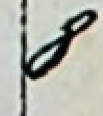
8
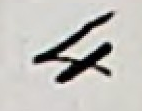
4
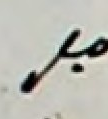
do
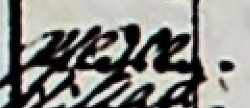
Pfldsberg
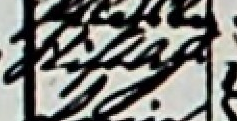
Stiftsg.
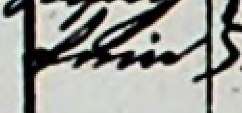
Rain
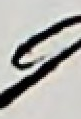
9
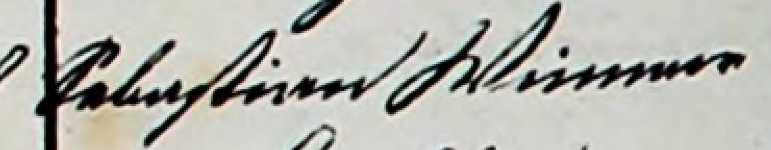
Sebastian Wimmer
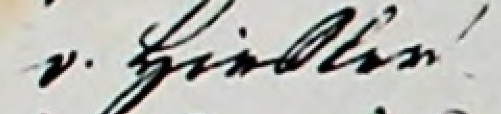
v. Hiesler
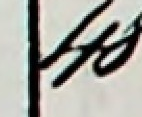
48
